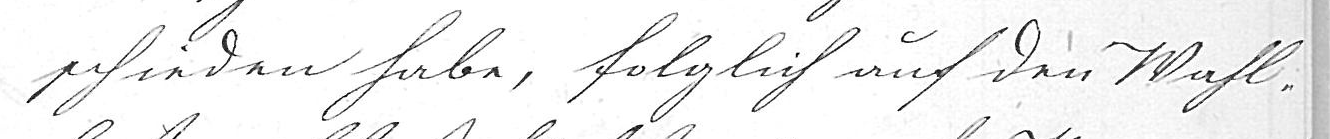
schieden habe, folglich auf den Wahl-
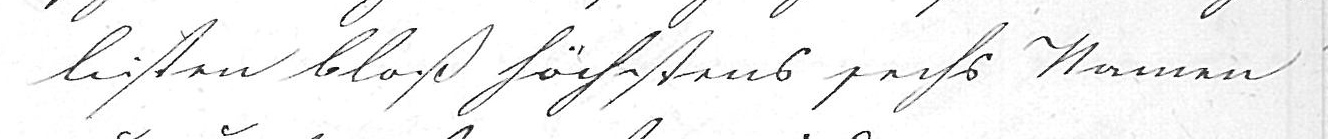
listen bloß höchstens sechs Namen
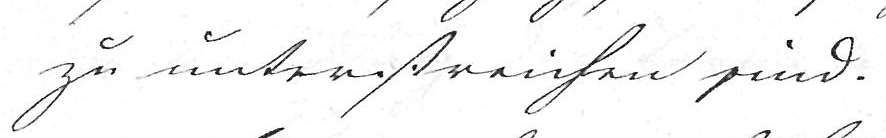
zu unterstreichen sind.
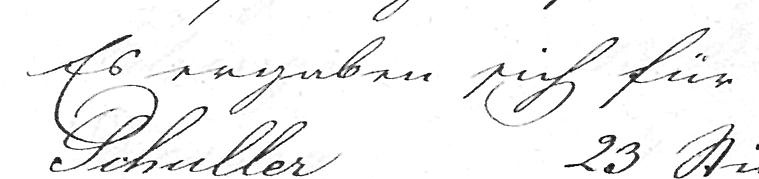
Es ergaben sich für
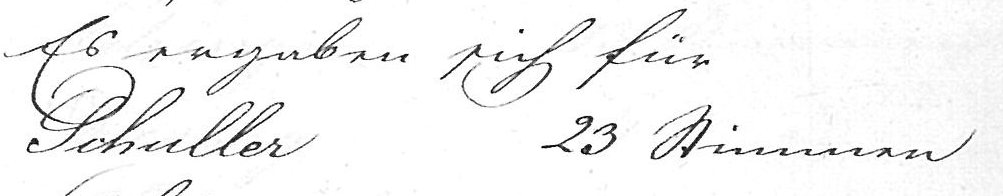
Schuller 23 Stimmen
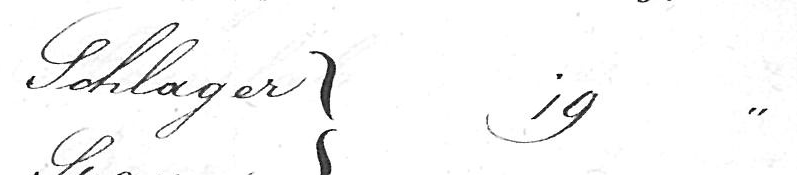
Schlager 19 "
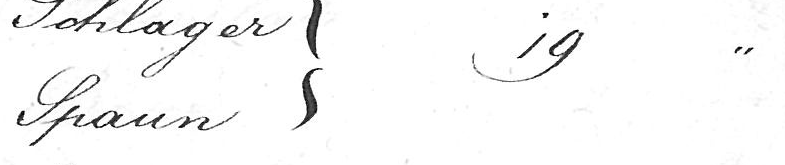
Spaun 19 "
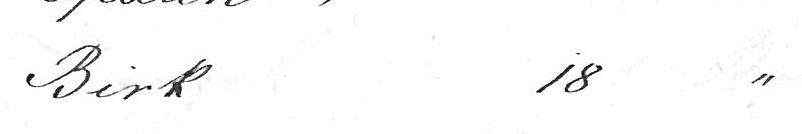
Birk 18 "
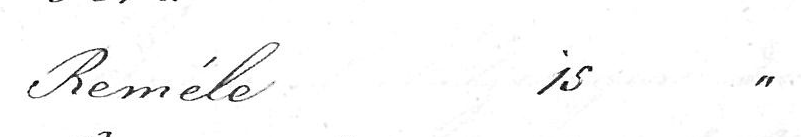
Reméle 15 "
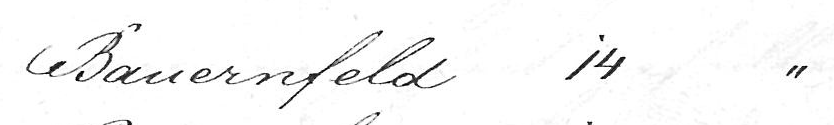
Bauernfeld 14 "
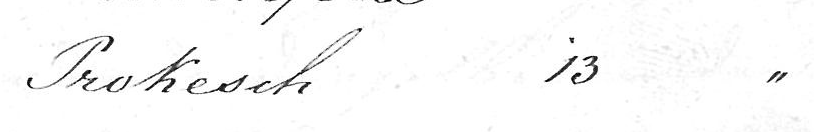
Prokesch 13 "
